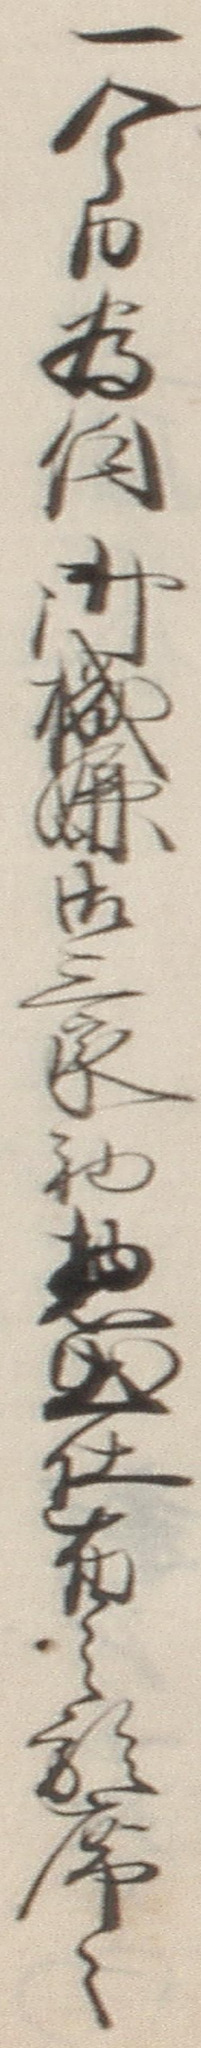一今日為伺御機嫌御三家初惣出仕有之願席之
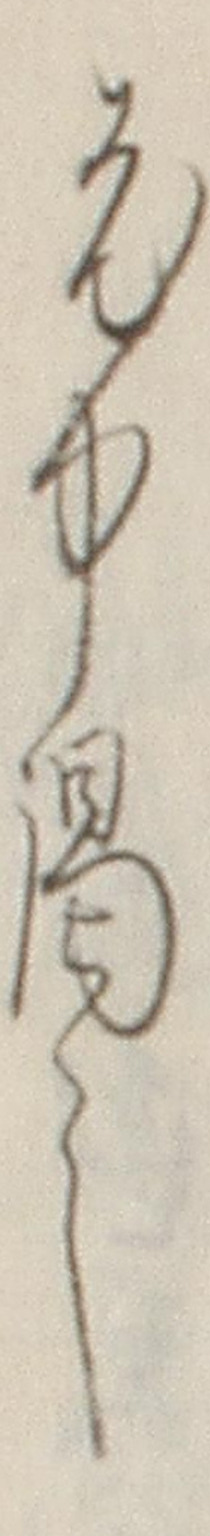老中謁之
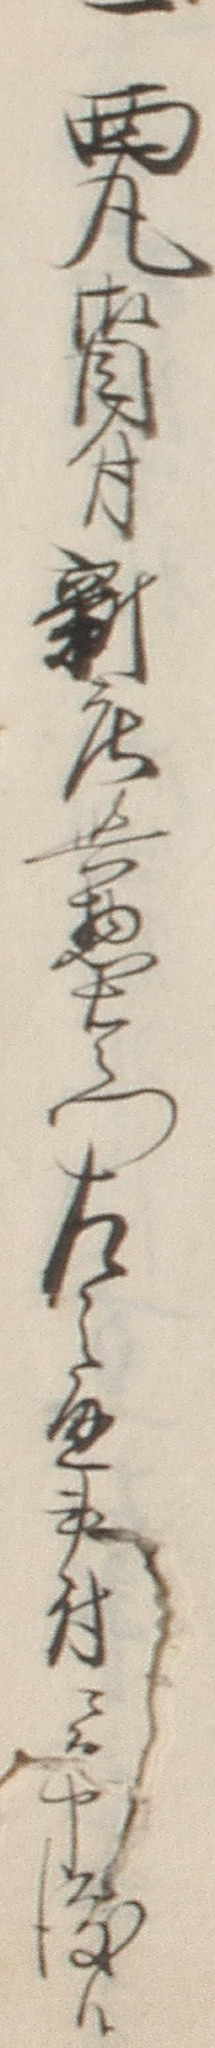一西丸御目付新居與惣右衛門左之通書付ニ而申渡候

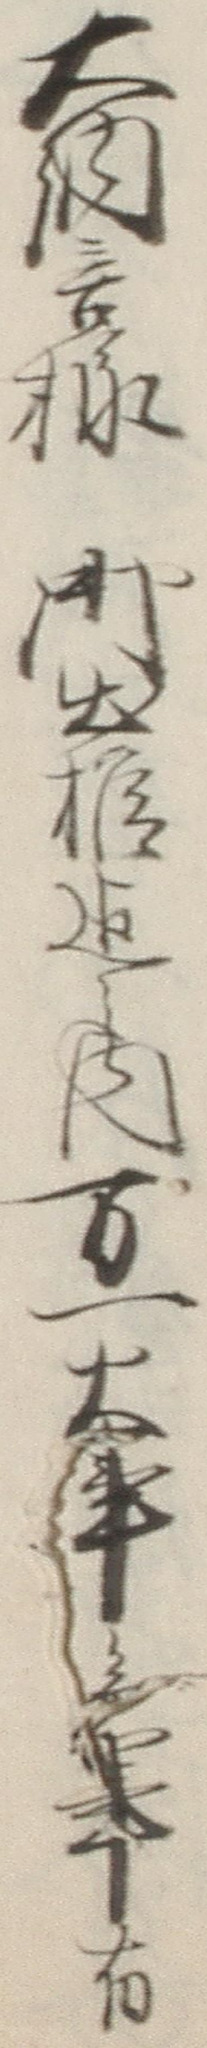大納言様御出棺迄之内万一火事ニ而御事有
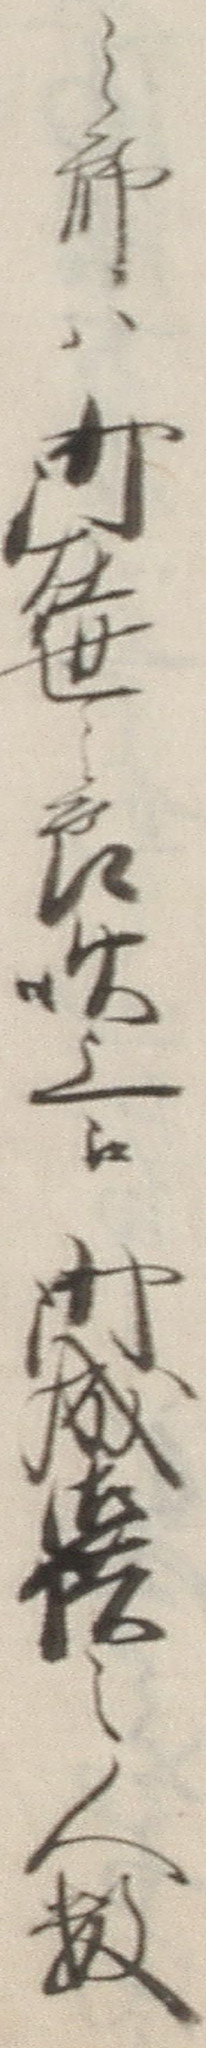之節ハ御在世之節吹上え御成御供之人数
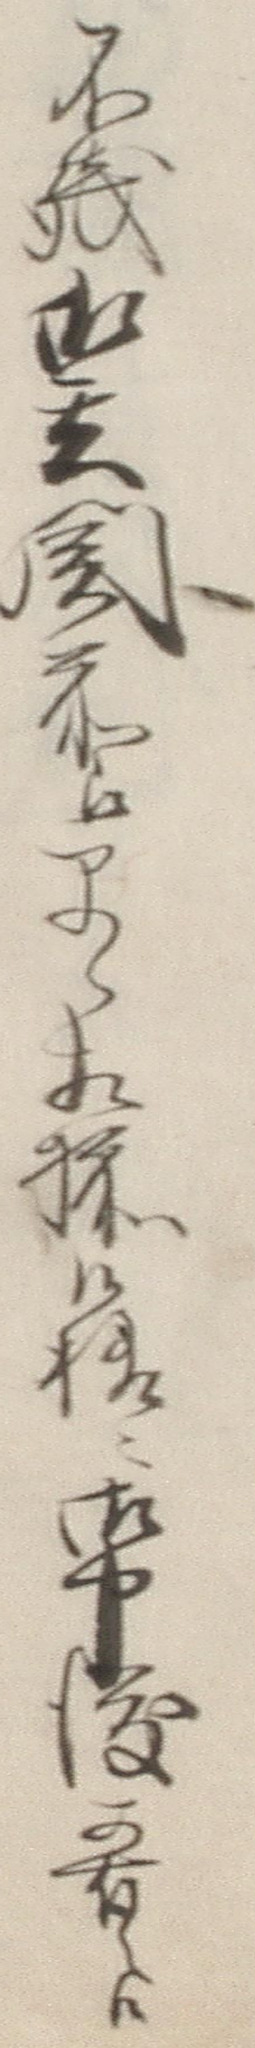不残御玄関前え早々相揃候様ニ御申渡可有之候
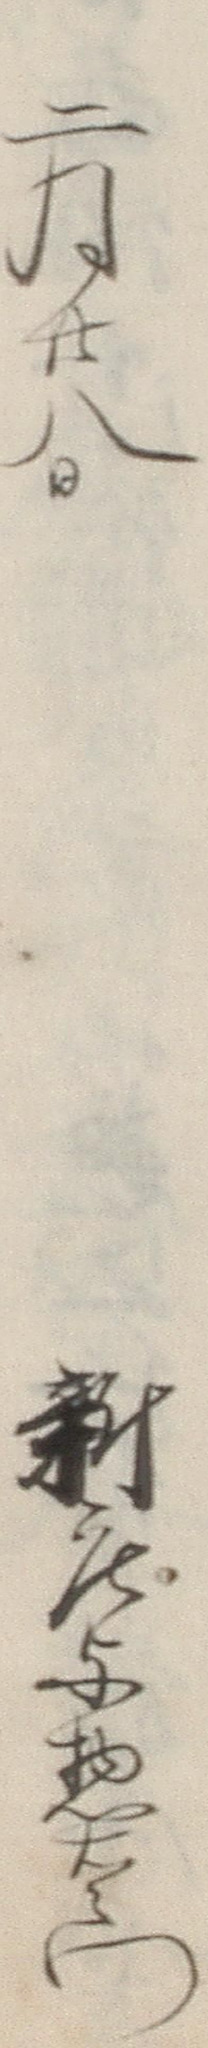二月二十八日新居与惣右衛門
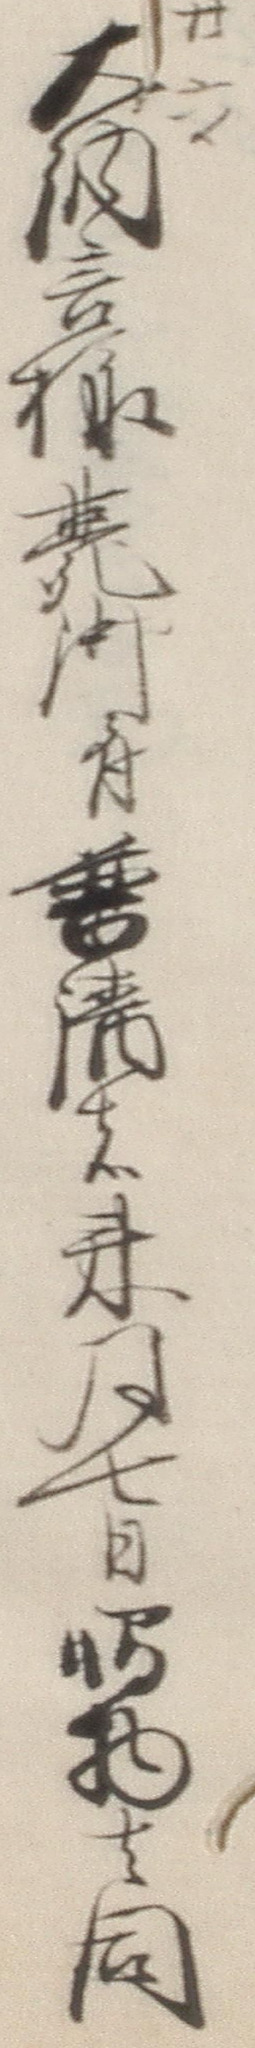大納言様薨御ニ付普請は来月七日鳴物は同
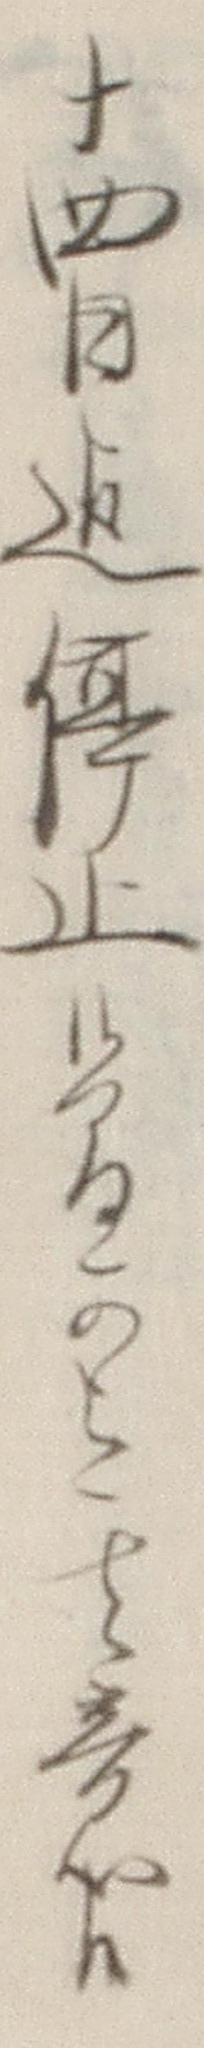十四日迄停止候間可有は其寄心候
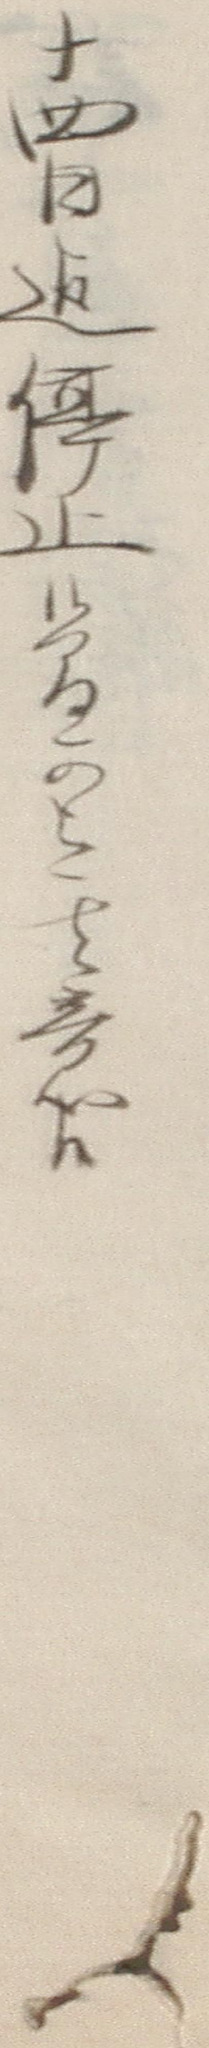十四日迄停止候間可有は其寄心候
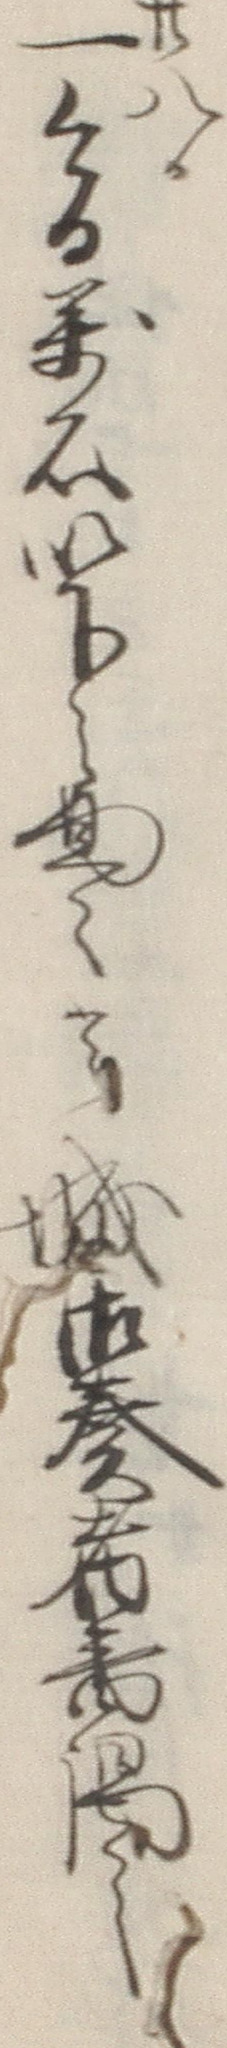一今日萬石以下之面々御登城御奏者番謁之
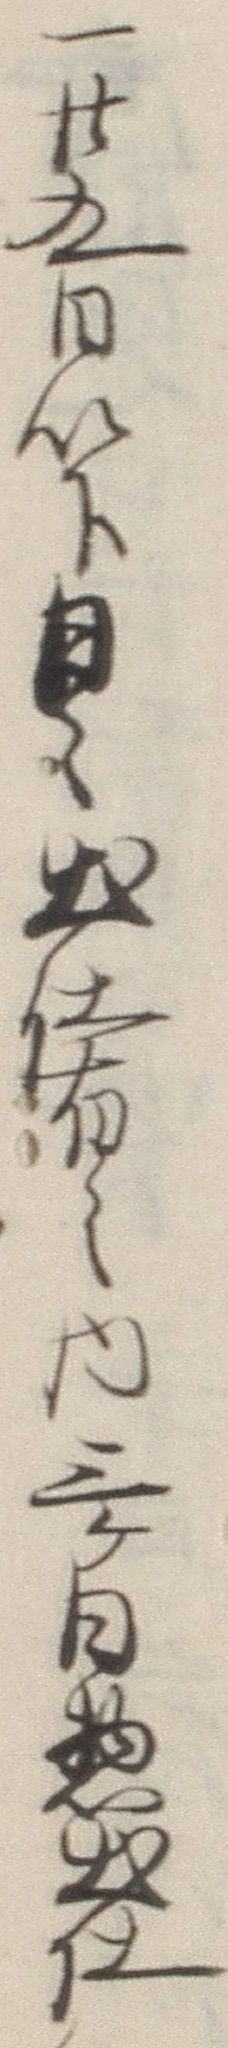一廿九日以下目々出仕有之内三ケ日惣出仕
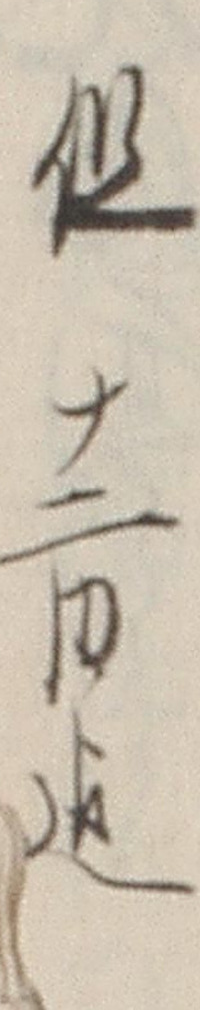但十二日迄
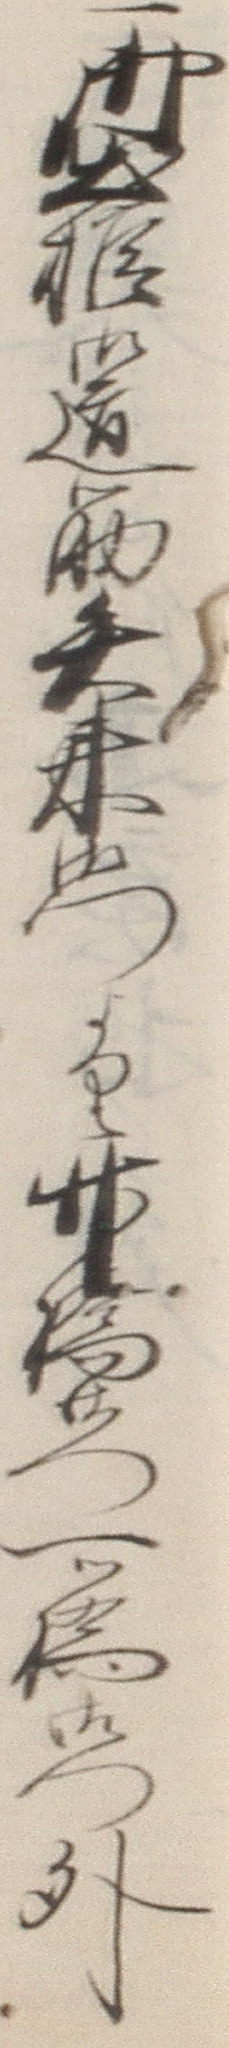御出棺御道筋矢来御門より竹橋御門一ツ橋御門外
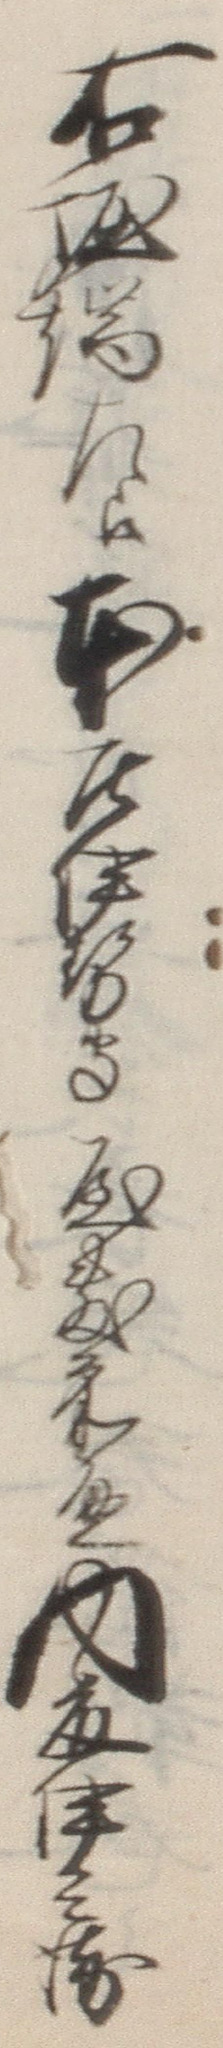右城端左え本庄伊勢守屋敷前通内藤伊兵衛
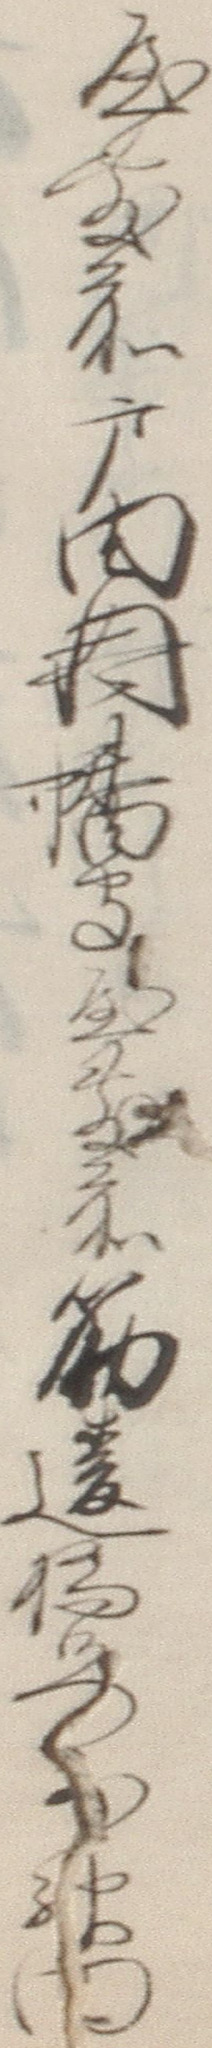屋敷前戸田因幡守屋敷前筋違橋御門外神田
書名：[諸国災害記録]
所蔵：東京大学地震研究所図書室 Earthquake Research Institute Library, The University of Tokyo, JAPAN
